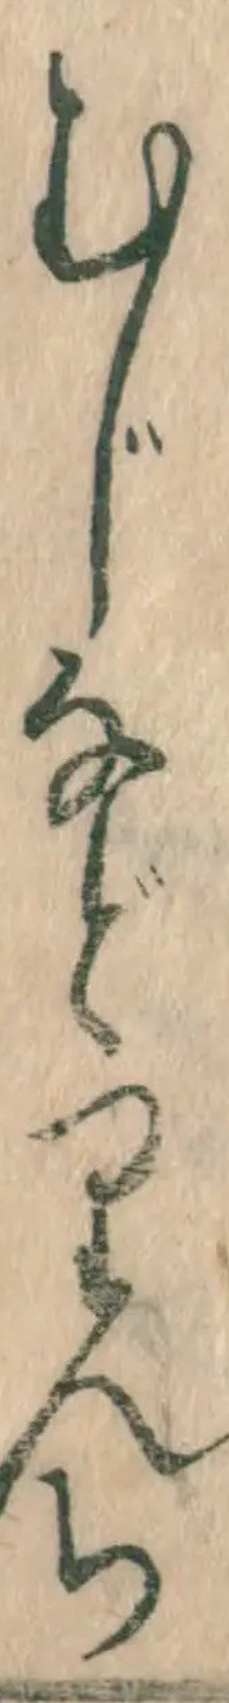むじなどりんち
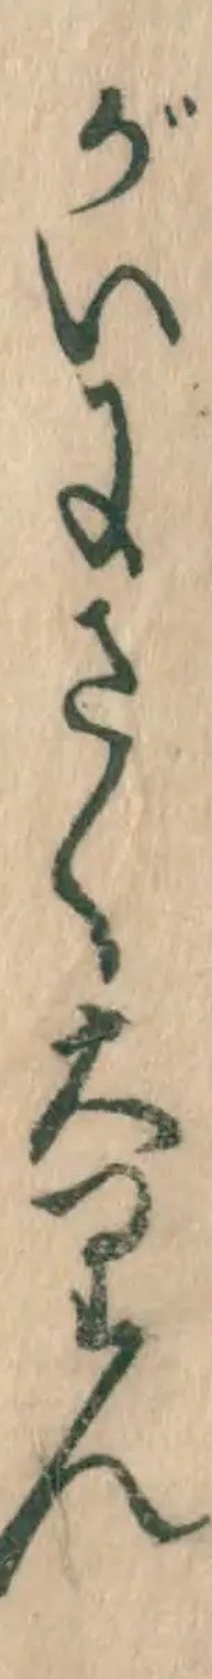がいにさく大りん

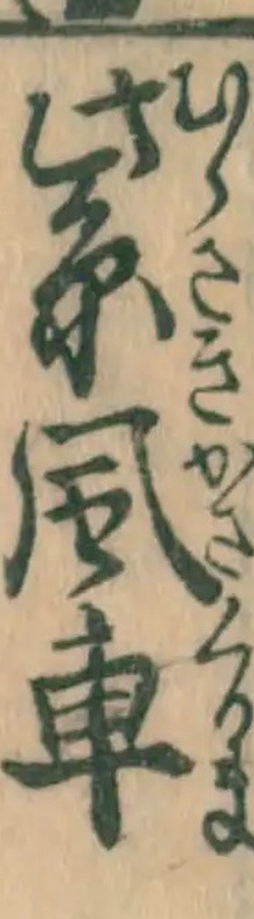紫風車
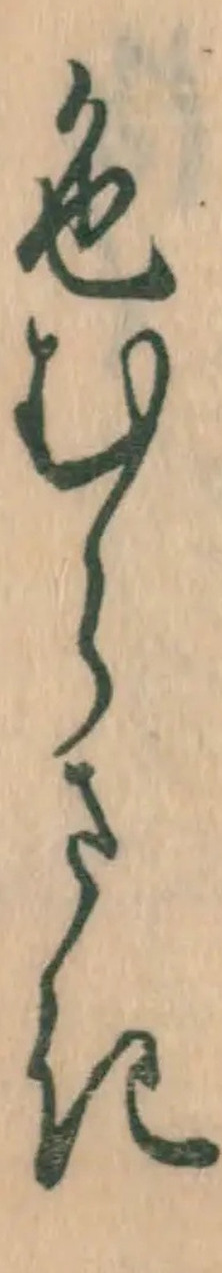色むらさき
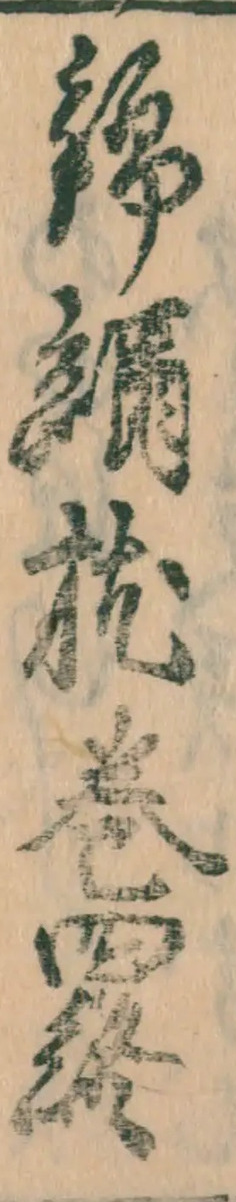錦繍枕巻四終
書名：錦繍枕 5巻. [4]
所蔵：国立国会図書館 National Diet Library, JAPAN
